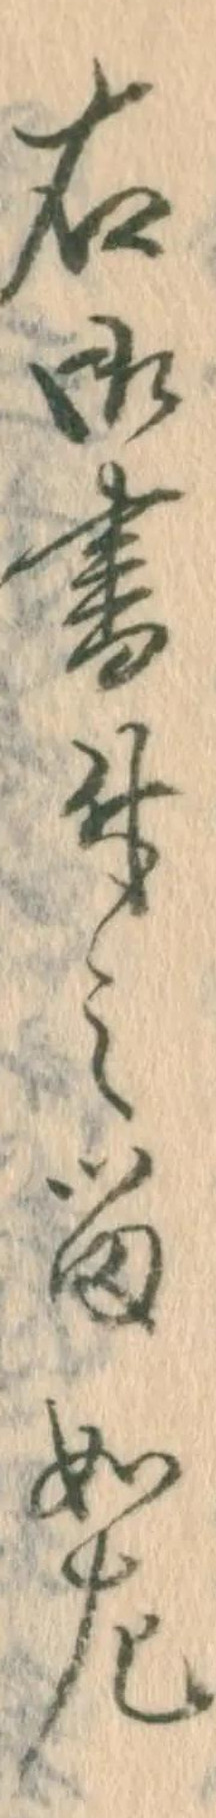右御書付之留如左
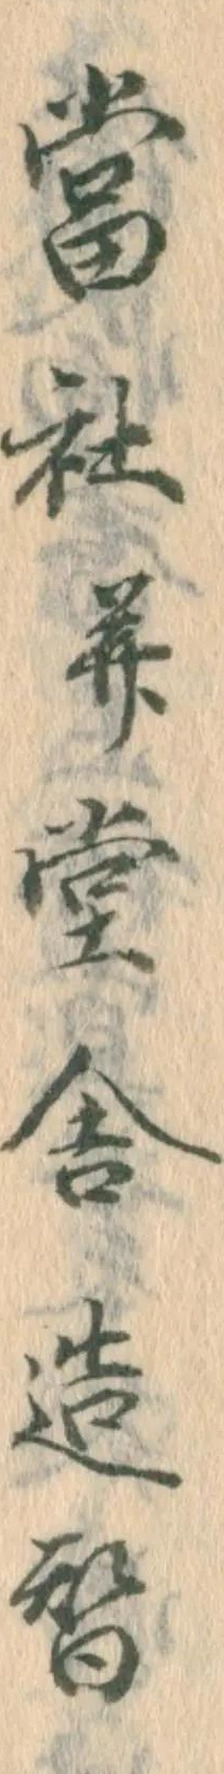当社并堂舎造替
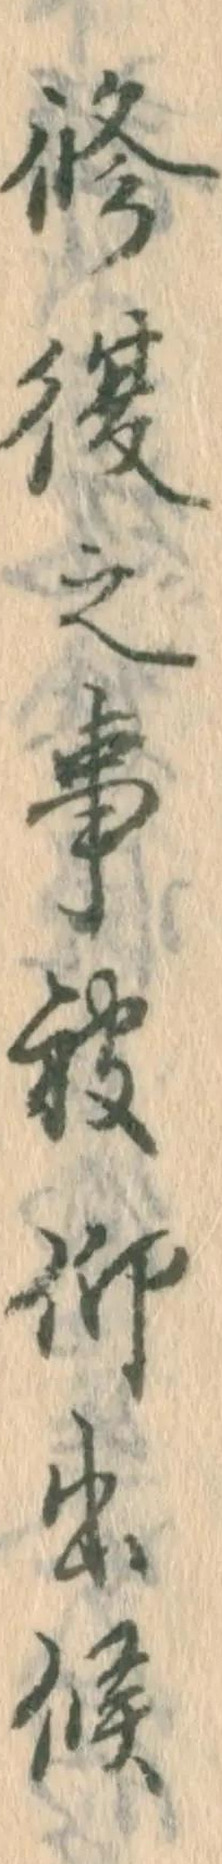修復之事被仰出候
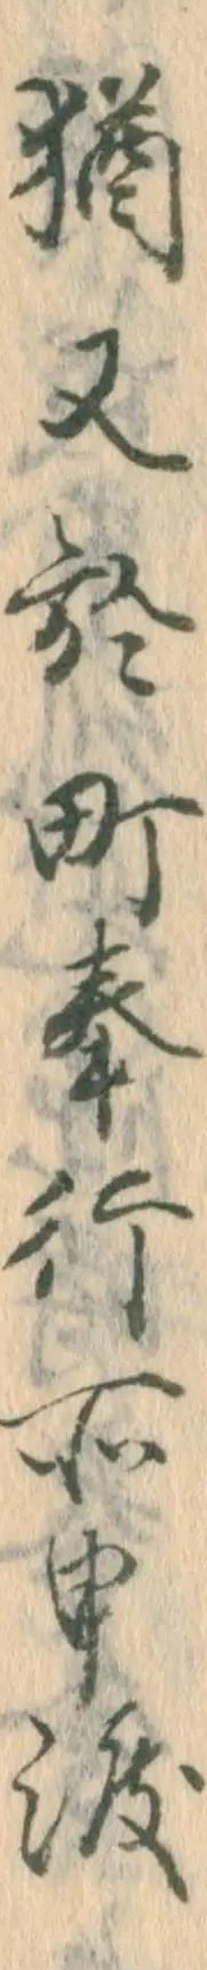猶又於町奉行所申渡
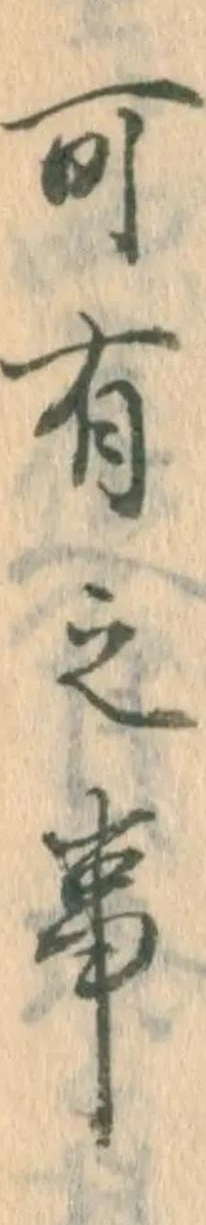可有之事

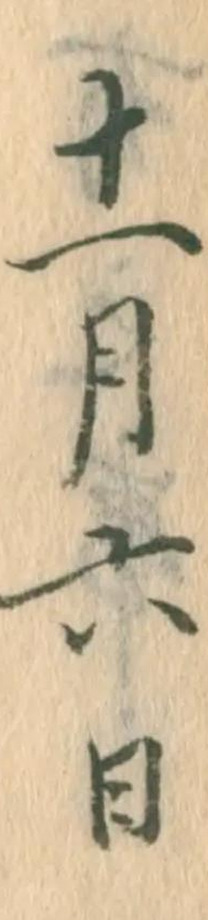十一月六日
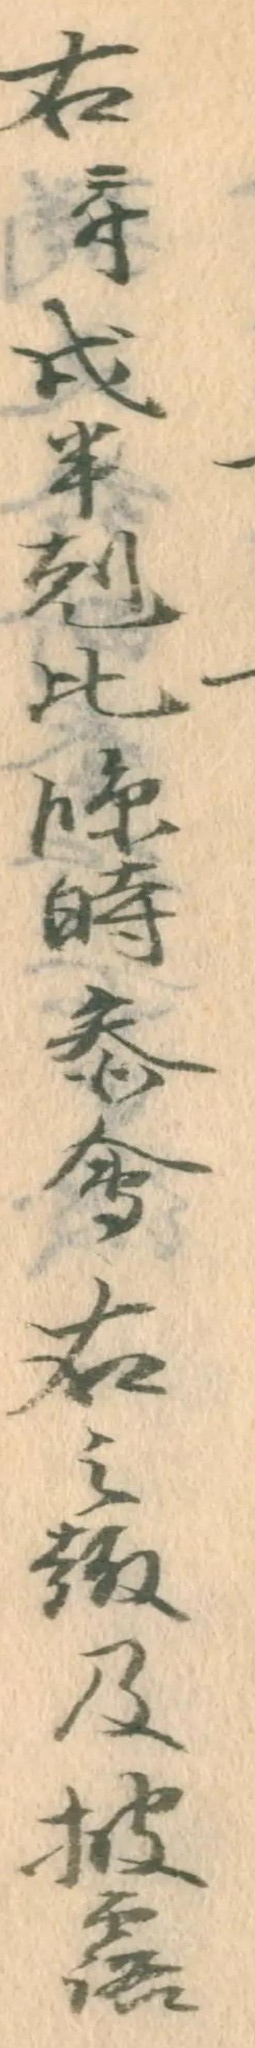右ニ付戌半剋比臨時参会右之趣及披露
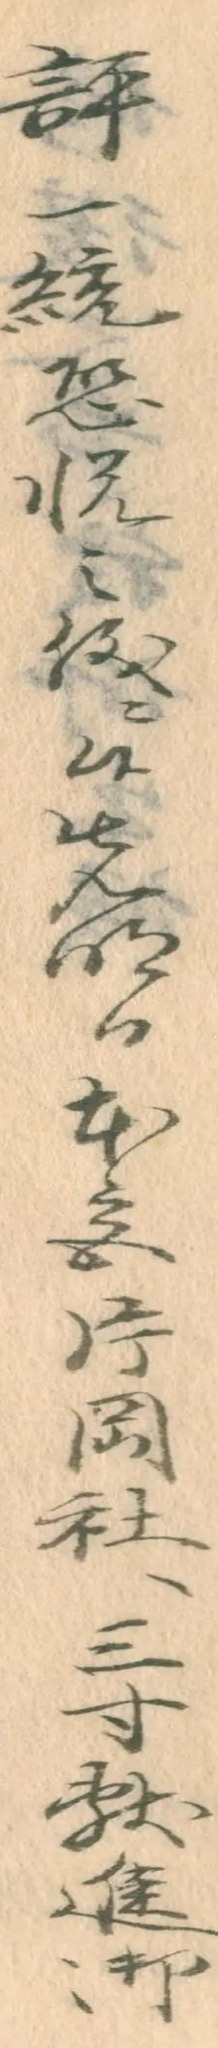評一統恐悦之儀ニ候先明日本宮片岡社へ三寸献進御
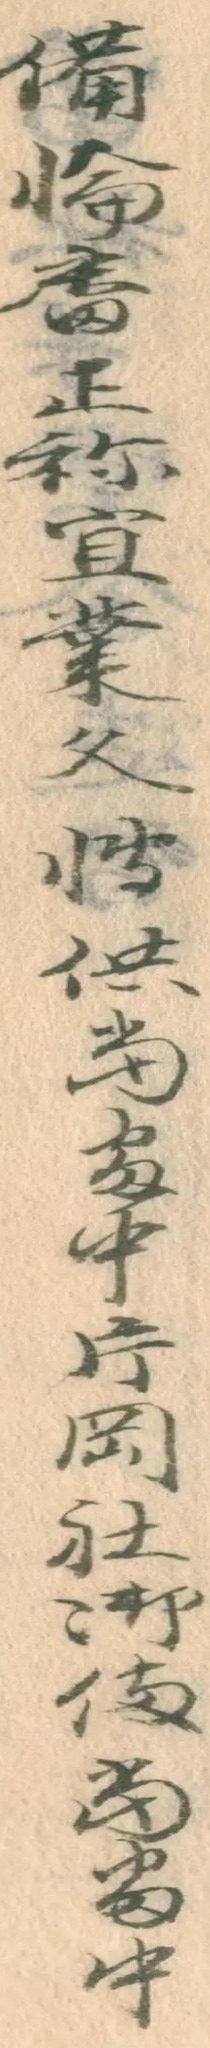備輪番正祢宜業久転供当番中片岡社御備当番中
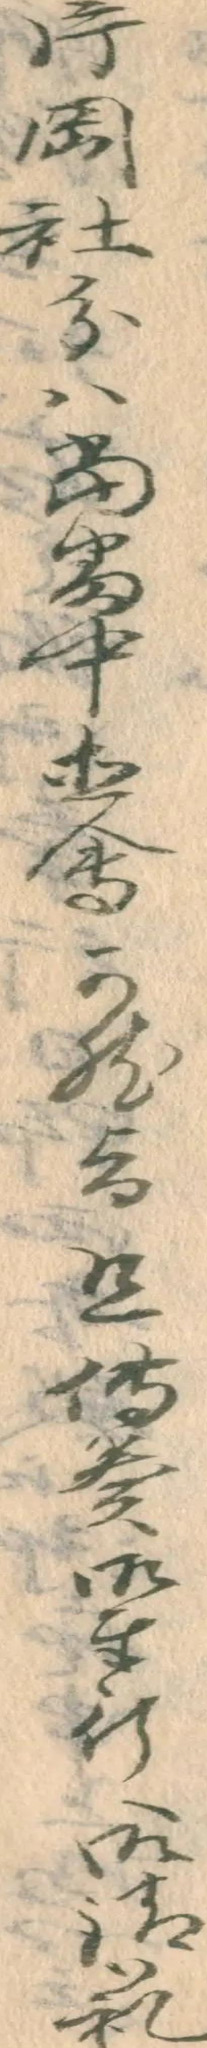片岡社分ハ当番中直会可然旨且伝奏御奉行へ御請御礼
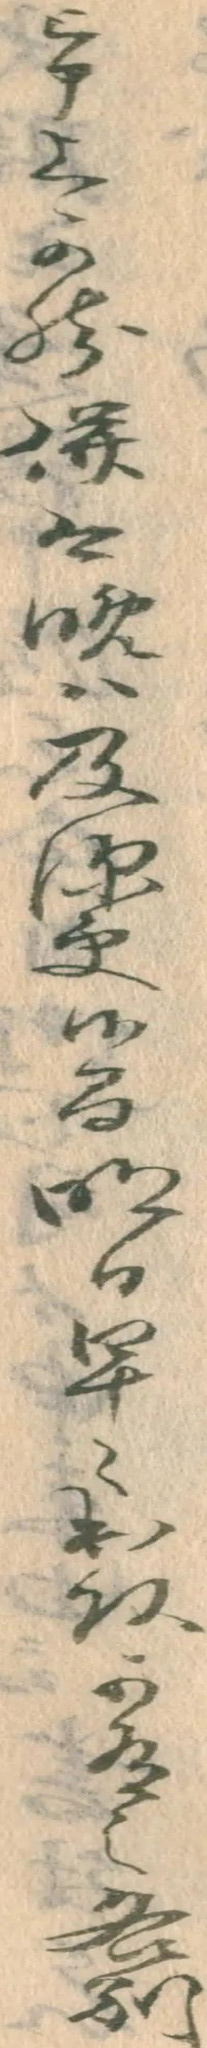被申上可然併今晩ハ及深更候間明日早々出頭可有之各別
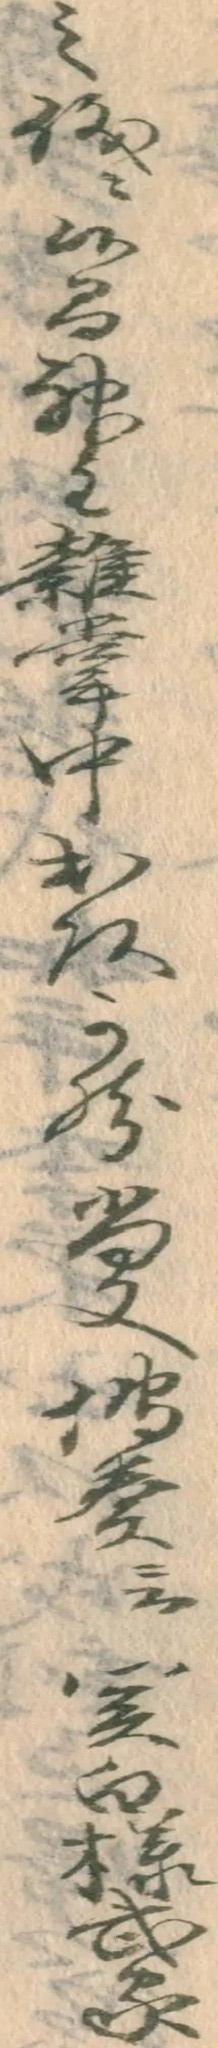之儀ニ候間神主雑掌中出頭可然尚又伝奏ニ而関白様武家
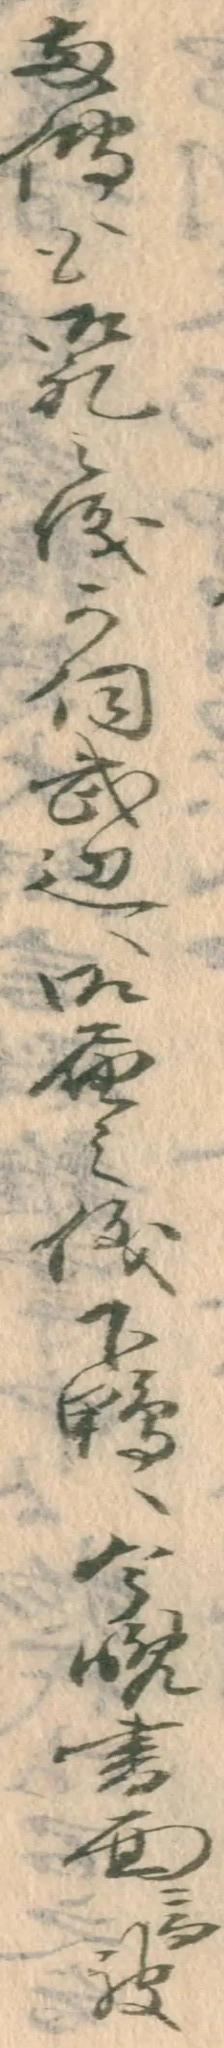両伝へも御礼之儀可伺武辺へ御届之儀下鴨へ今晩書面ニ而被
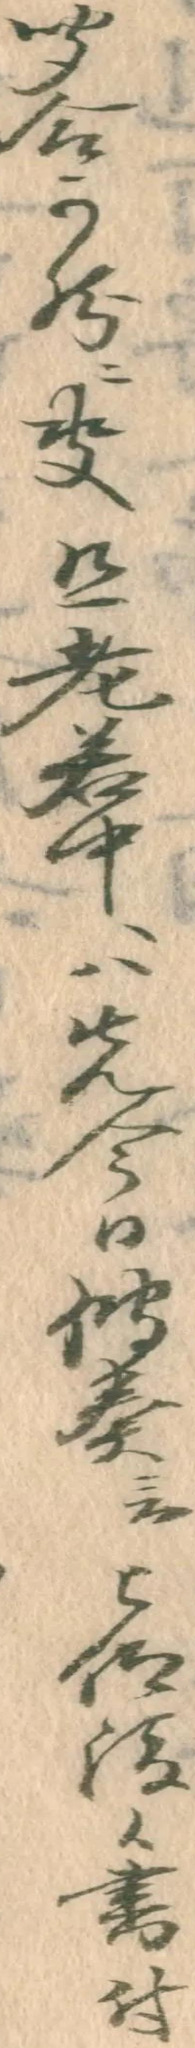聞合可然ニ決且老若中へハ先今日伝奏ニ而被仰渡候書付
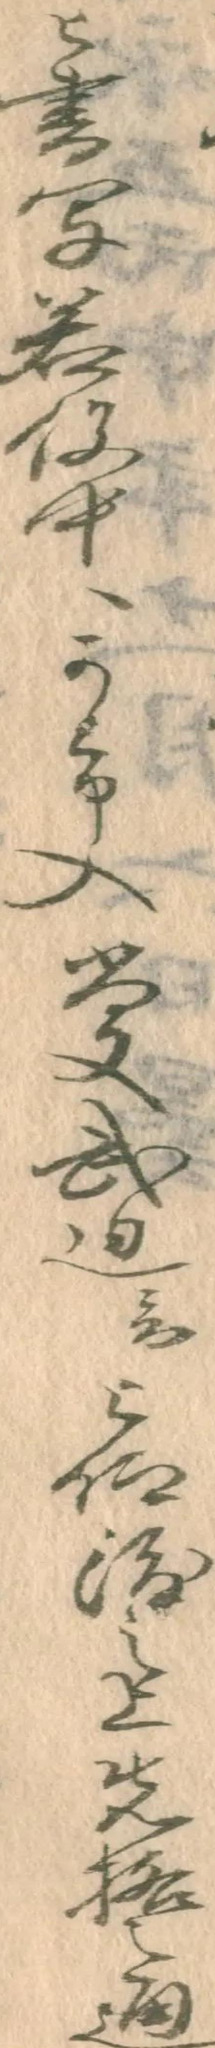被書写若役中へ可被申入尚又武辺ニ而被仰渡之上先格之通
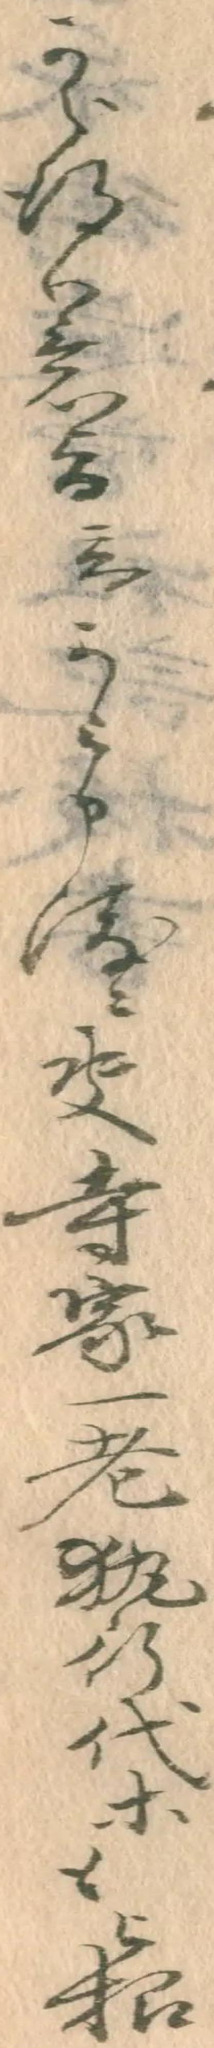可候得御意旨ニ而可被申渡ニ決寺家一老執行代等も被招
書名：賀茂社記録. 第17冊
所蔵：国立国会図書館 National Diet Library, JAPAN
